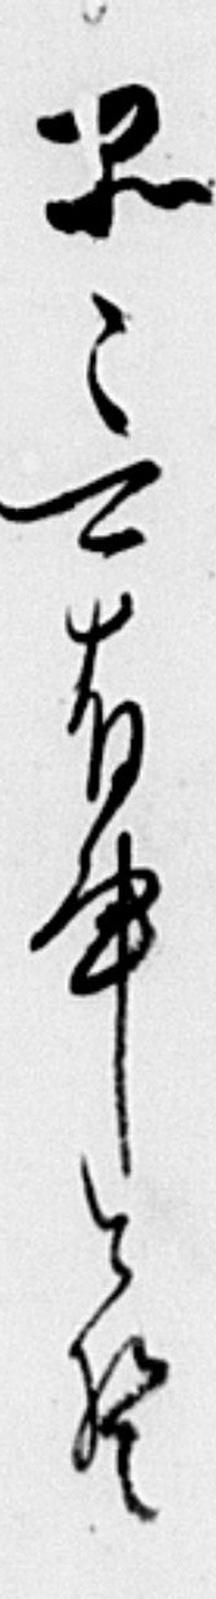品々可有事とそ
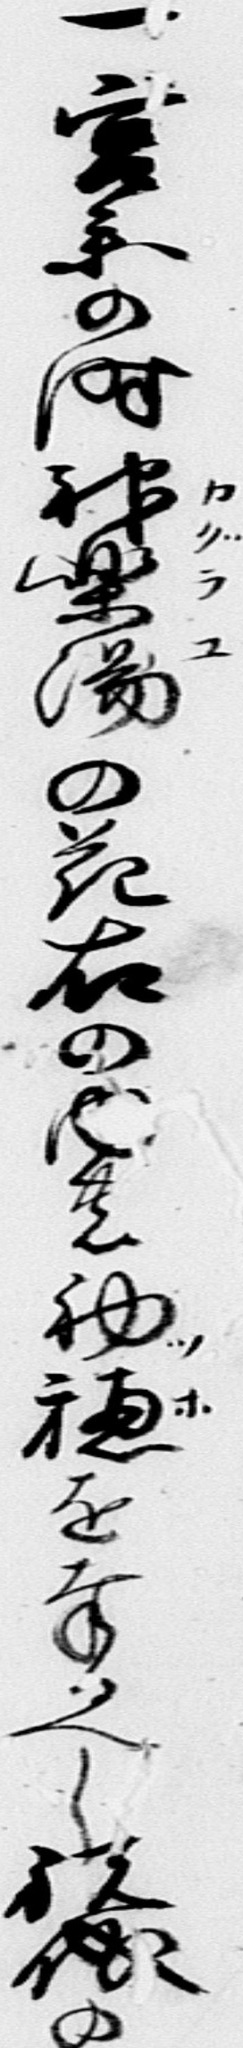一宮参の時神楽湯の花右の内の初つ穂を奉るへし祝の
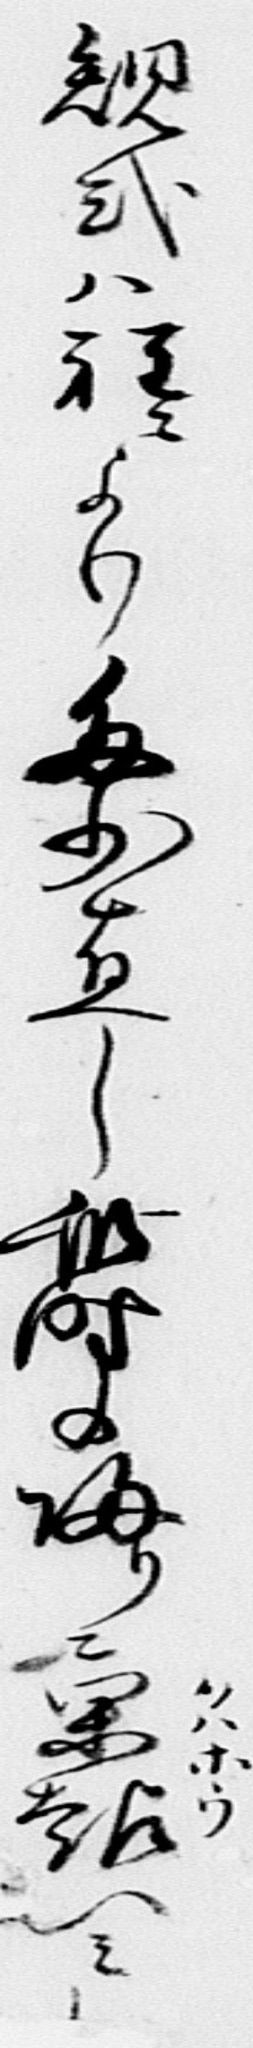規式は程により多少有へし此時の帰りに果報いみ
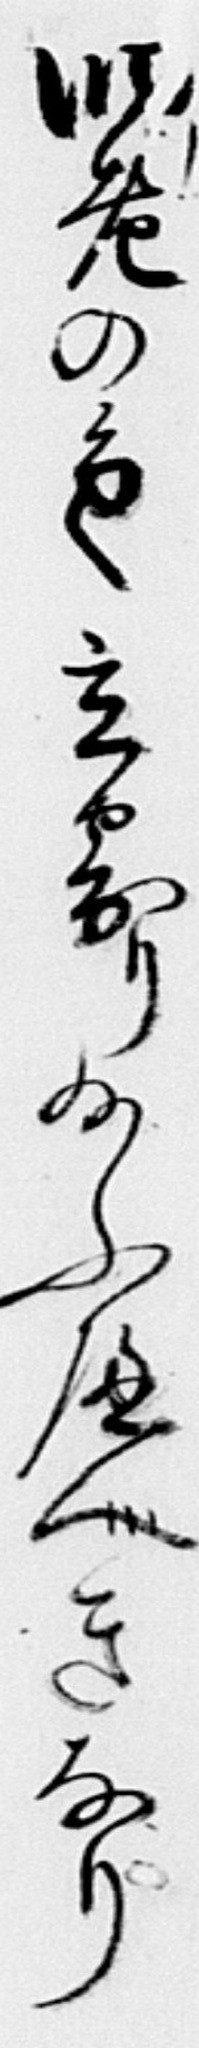旧老の方へ立寄り給ふへきなり
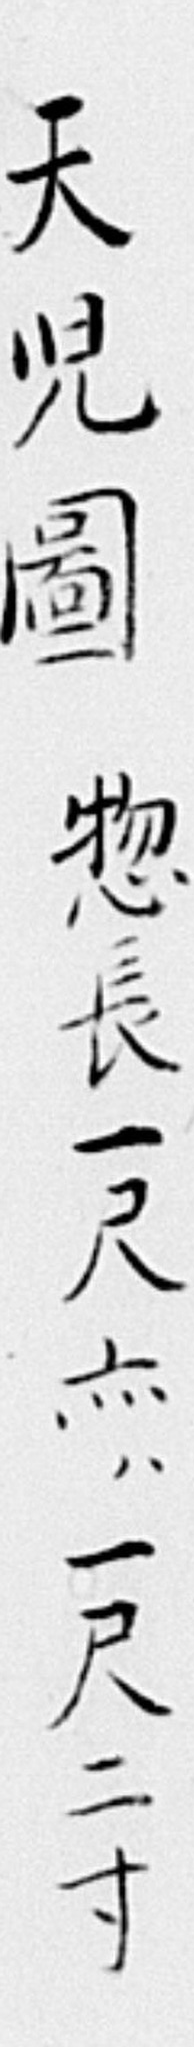天児図惣長一尺亦ハ一尺二寸
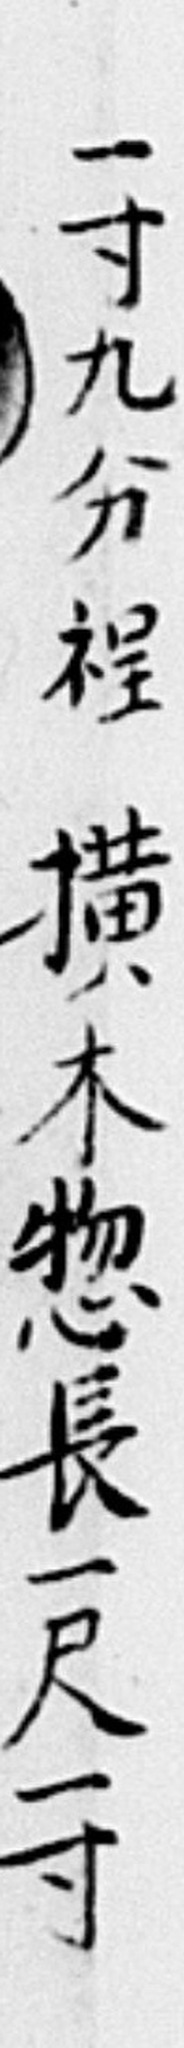一寸九分程横木惣長一尺一寸
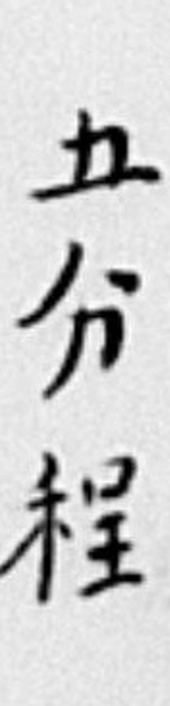五分程
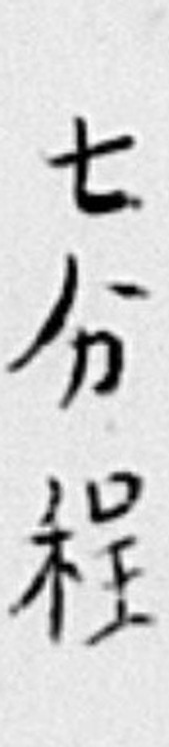七分程
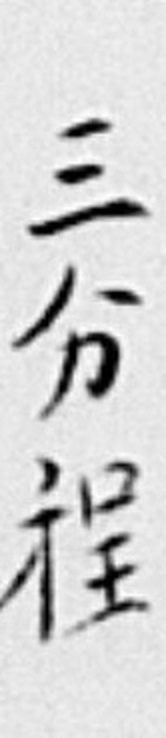三分程
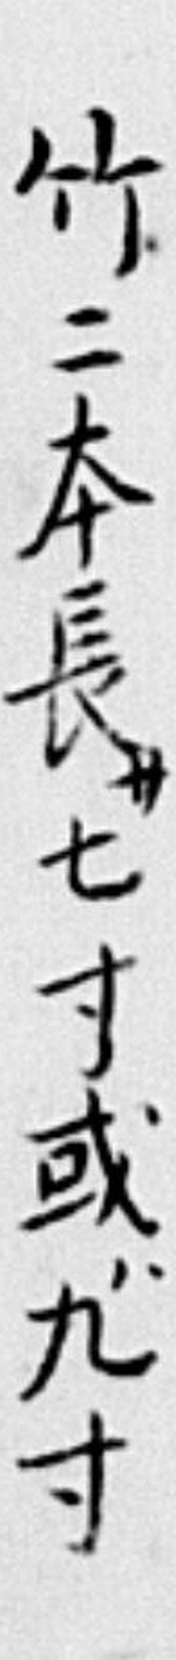竹ニ本長サ七寸或ハ九寸
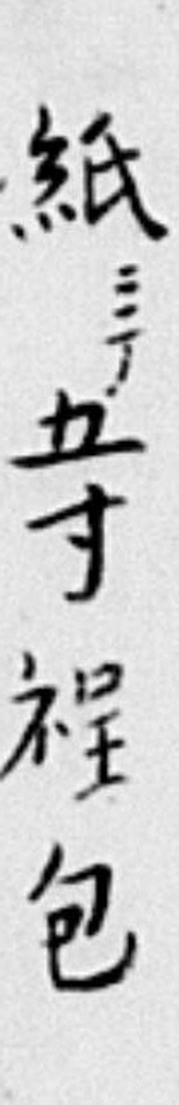紙ニテ五寸程包
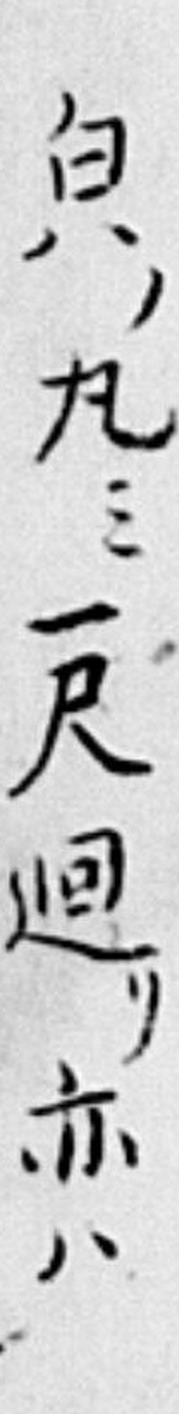㒵ノ丸ミ一尺廻リ亦ハ
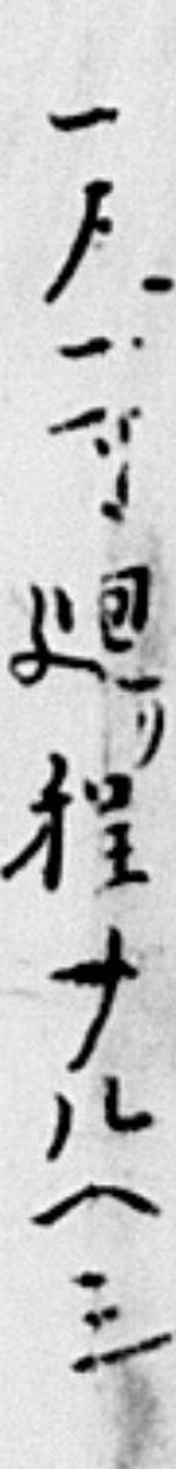一尺一寸廻リ程ナルヘシ

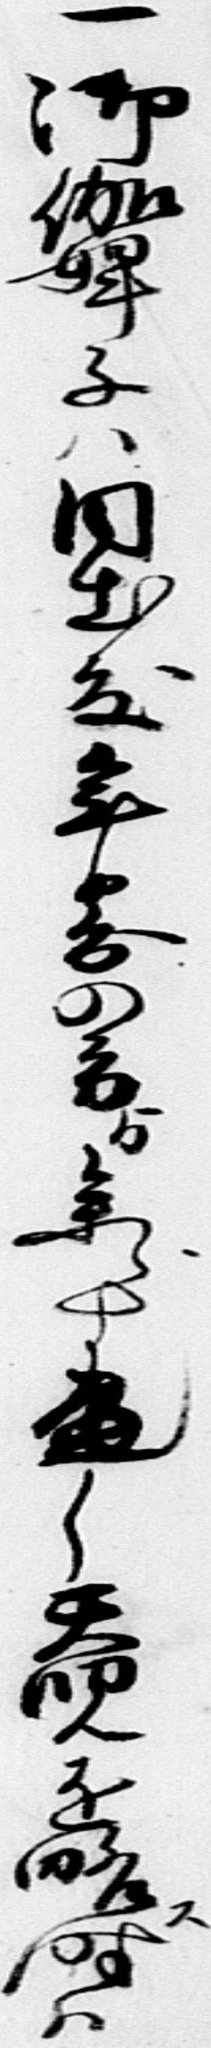一御伽婢子は目出度年寄の方より参らすへし天児を略す時は
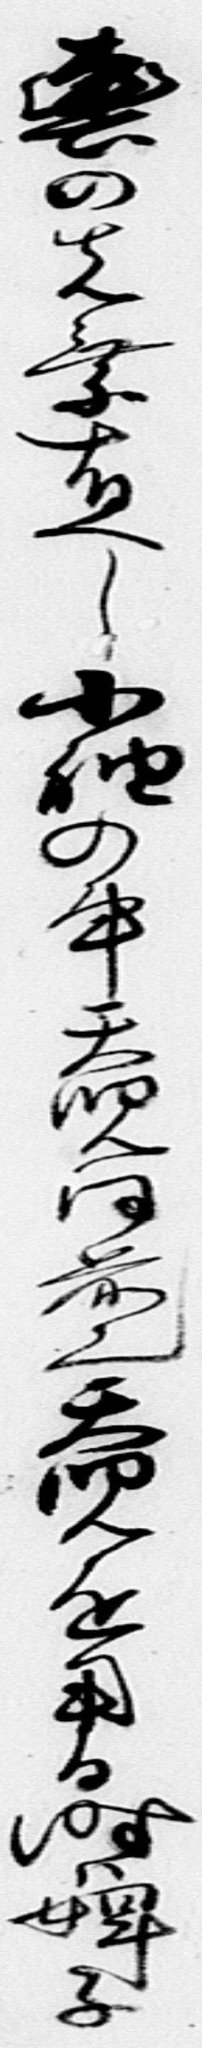輿の先乗有へし小袖の事天児同前也天児を用る時は婢子
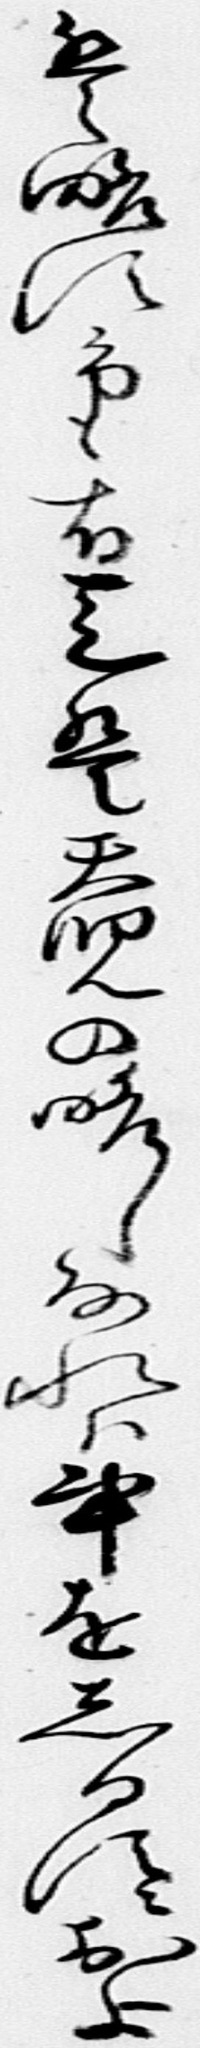は略す方も有是は天児の略しなれは事をしるすにおよ
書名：天児之書（あまがつのしょ）
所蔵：徳島県立図書館
